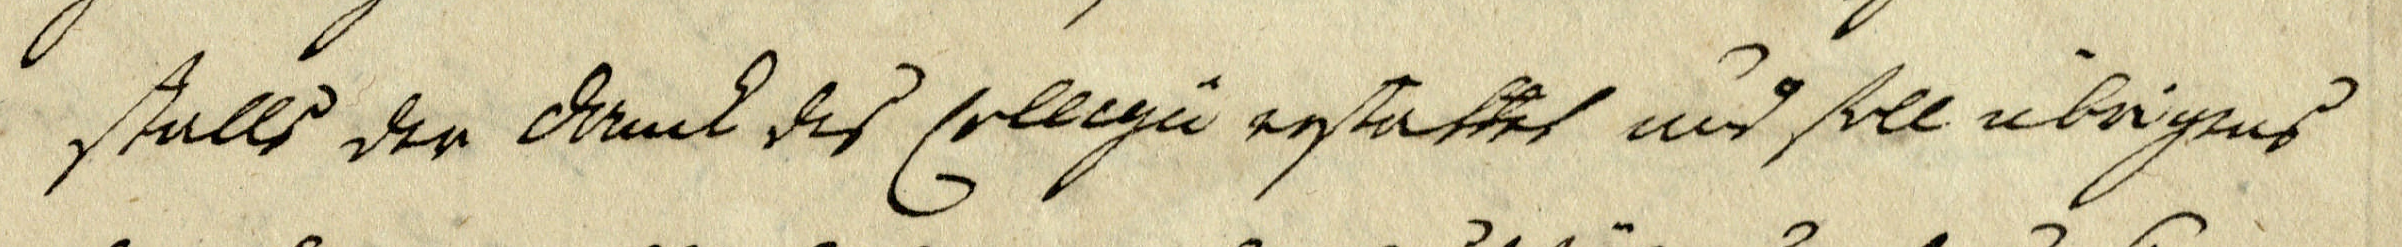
stalls der Danck des Collegii erstattet und soll übrigens
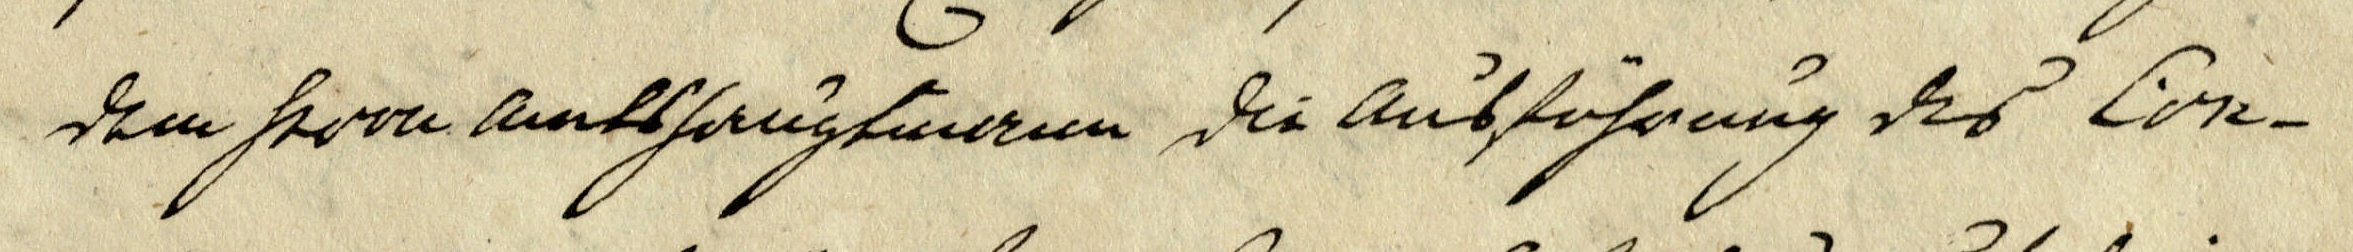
dem Herrn Amtshauptmann die Ausführung des Con¬
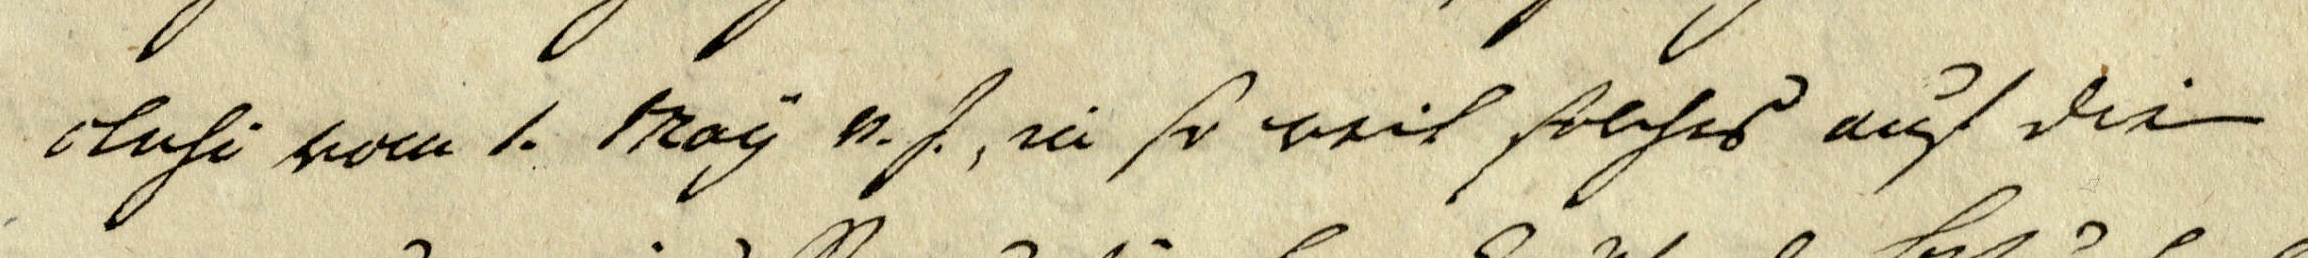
clusi vom 1. Maÿ v. J., in so weit solches auf die
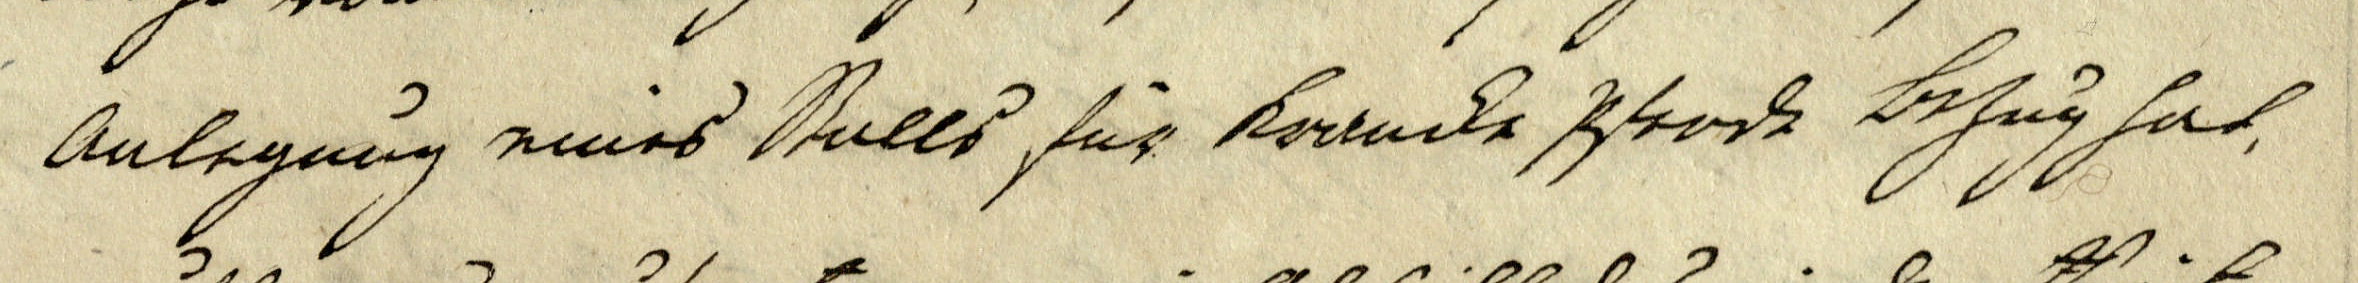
Anlegung eines Stalls für krancke Pferde Bezug hat,
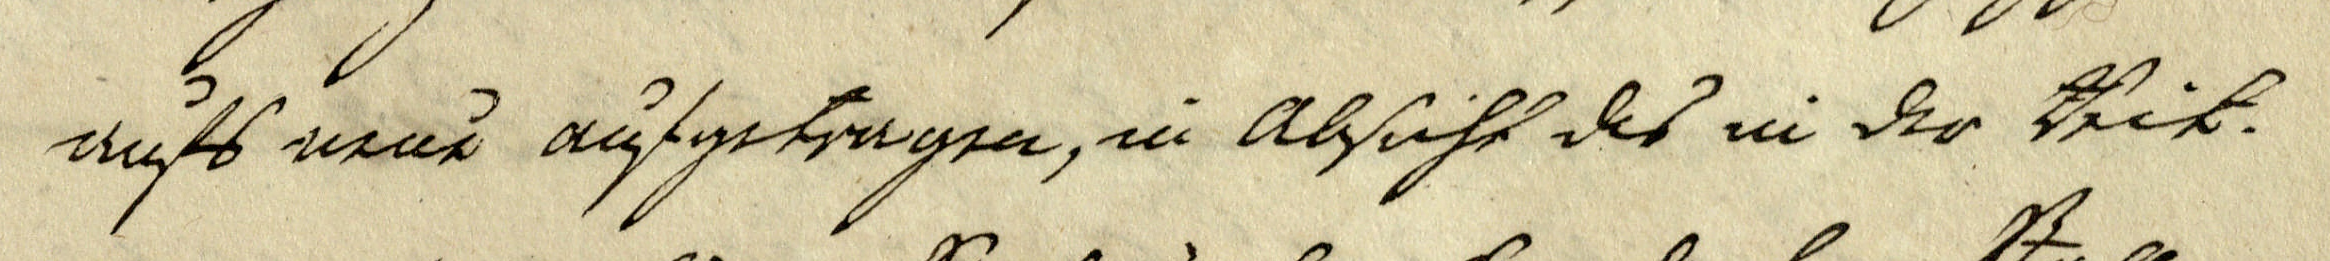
aufs neue aufgetragen, in Absicht des in der Reit¬
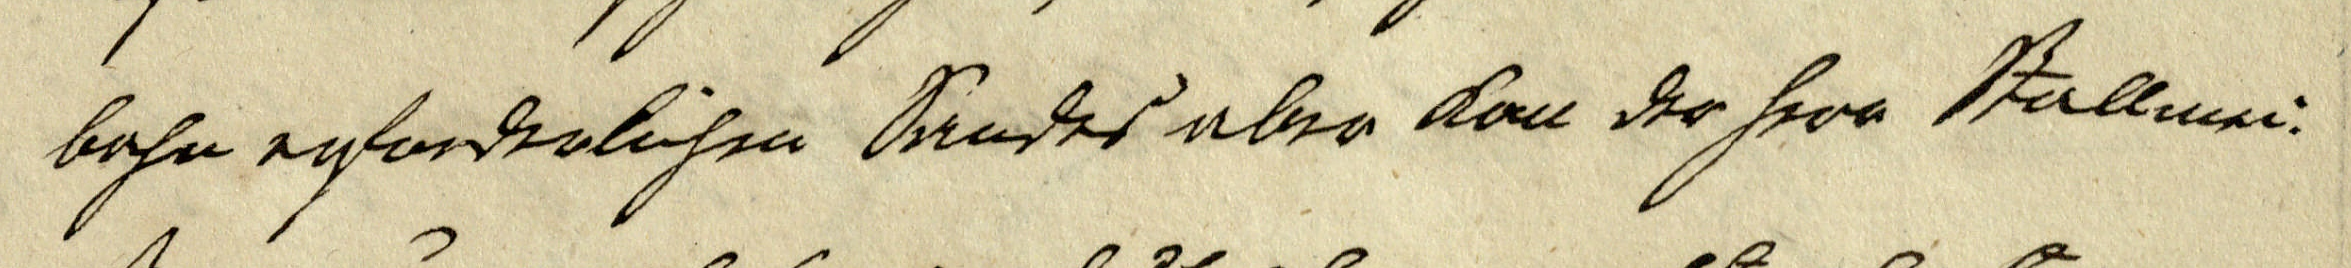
bahn erforderlichen Sandes aber kan der Herr Stallmei¬
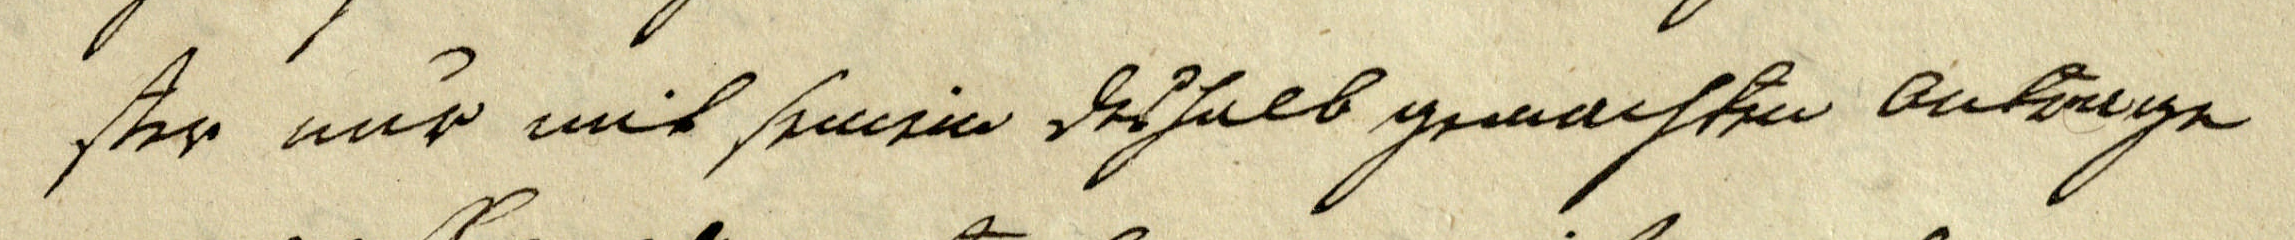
ster nur mit seinem deshalb gemachten Antrage
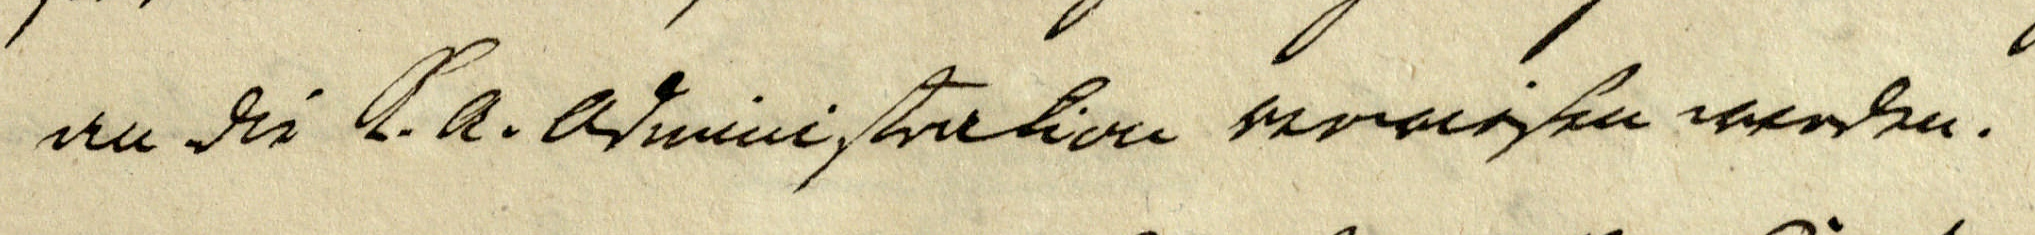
an die K. A. Administration verwiesen werden.
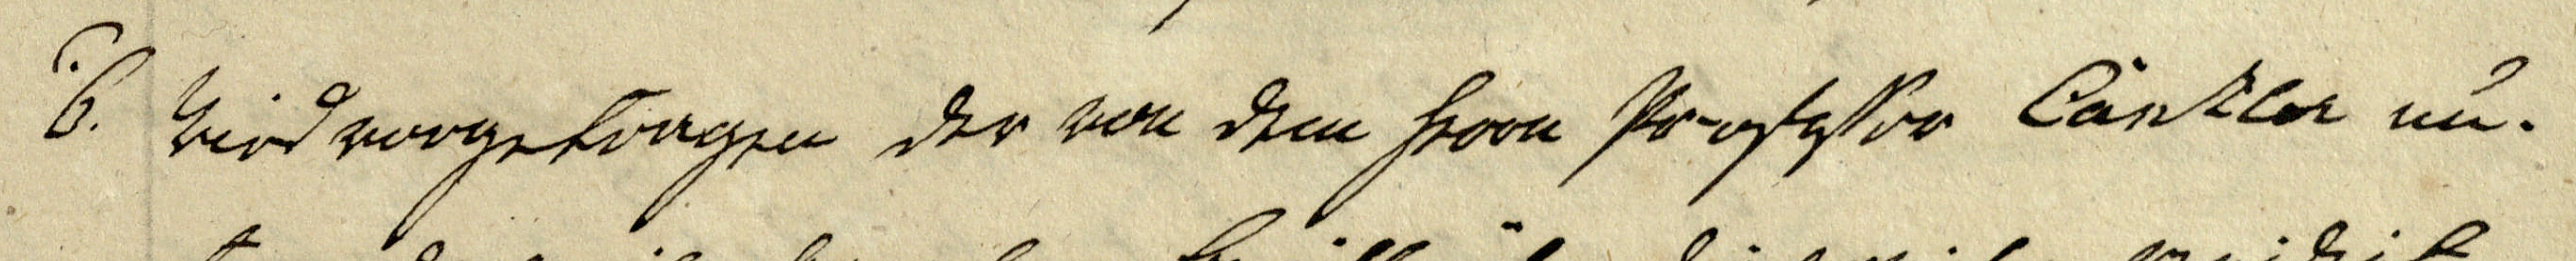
6. Wird vorgetragen der von dem Herrn Professor Canzler un¬
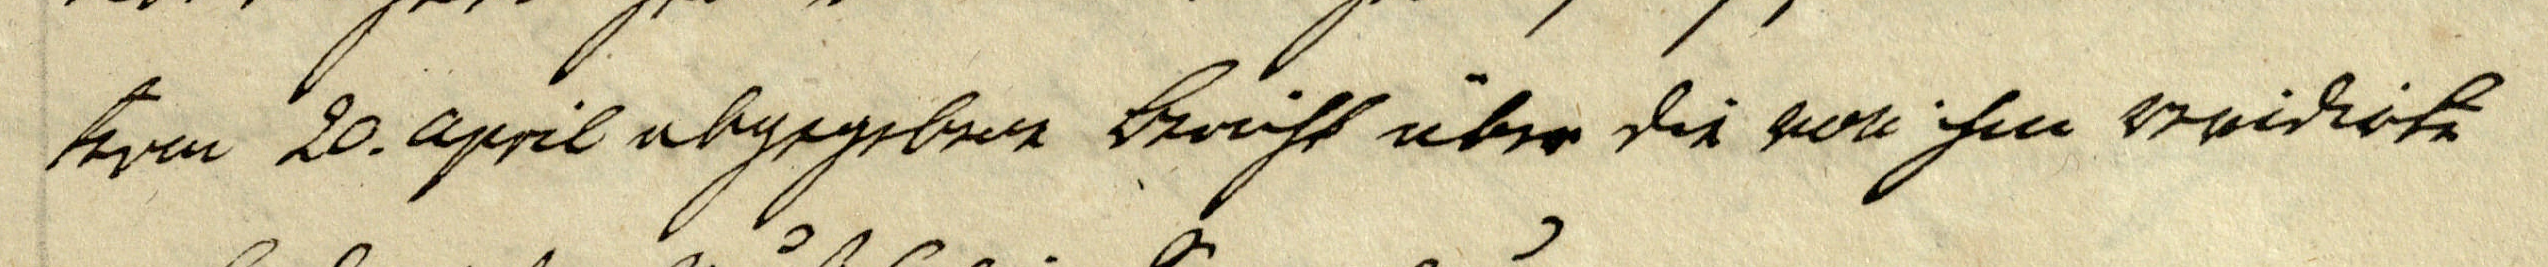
term 20. April abgegebene Bericht über die von ihm revidirte
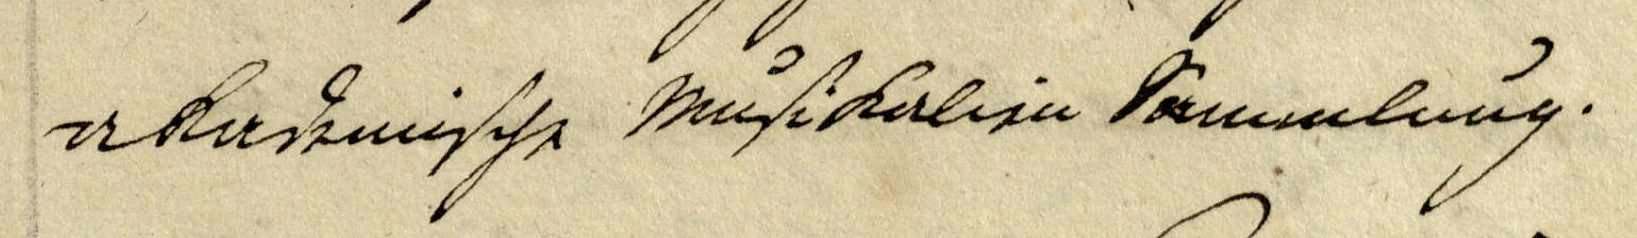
akademische Musikalien Sammlung.
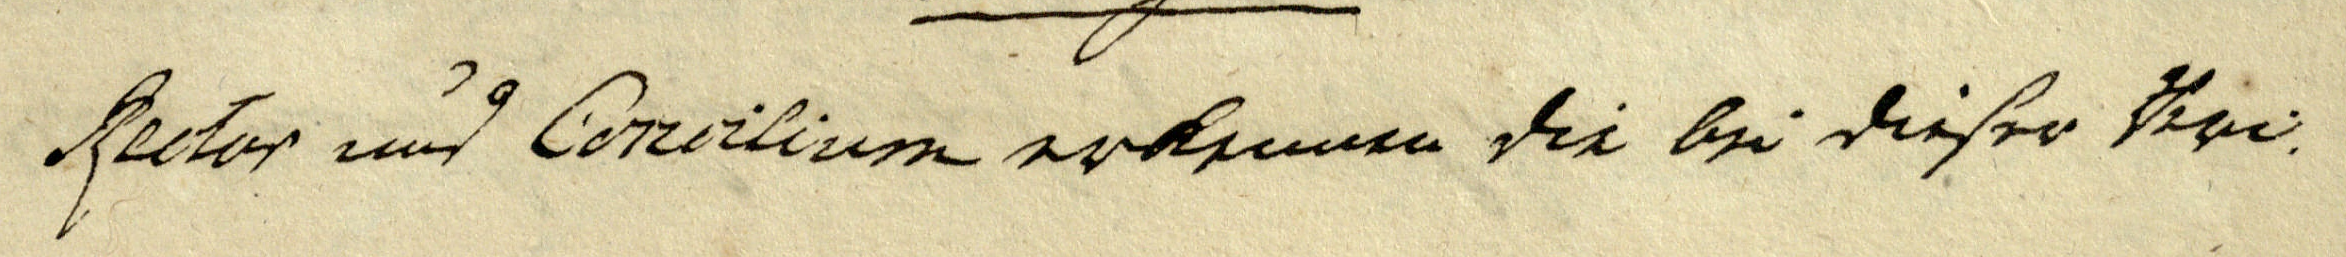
Rector und Concilium erkennen die bei dieser Revi¬
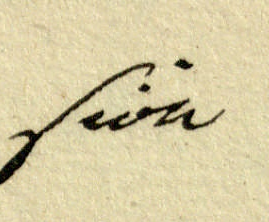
sion
